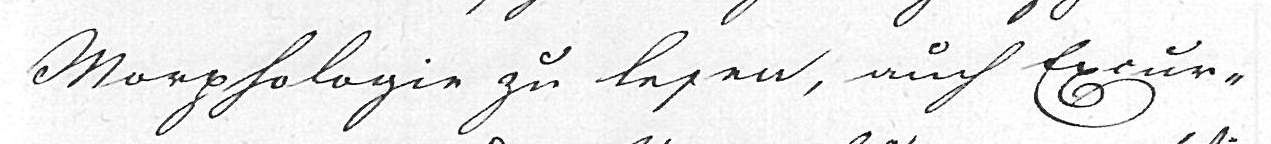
Morphologie zu lesen, auch Excur-
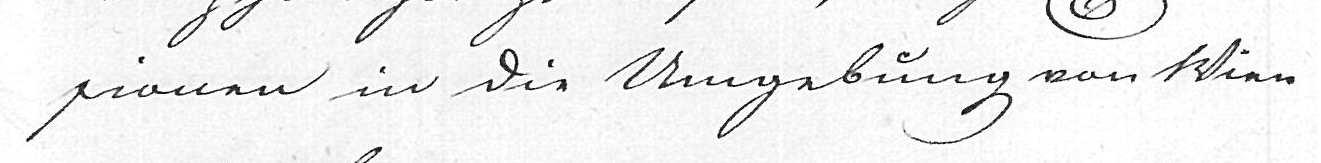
sionen in die Umgebung von Wien
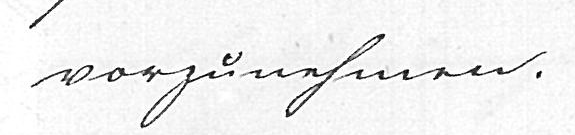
vorzunehmen.
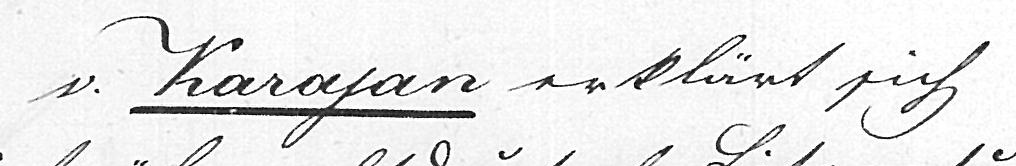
v. Karajan erklärt sich
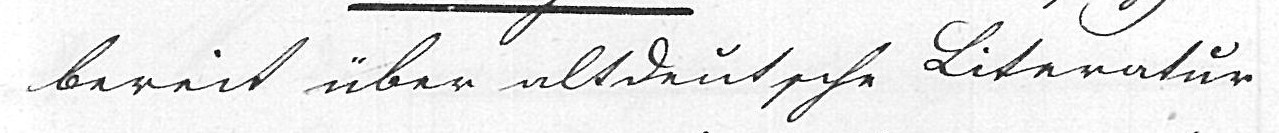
bereit über altdeutsche Literatur
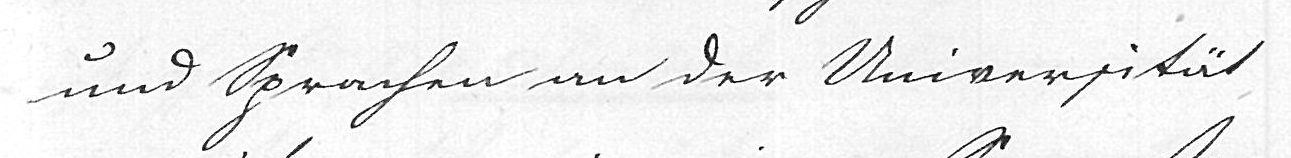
und Sprachen an der Universität
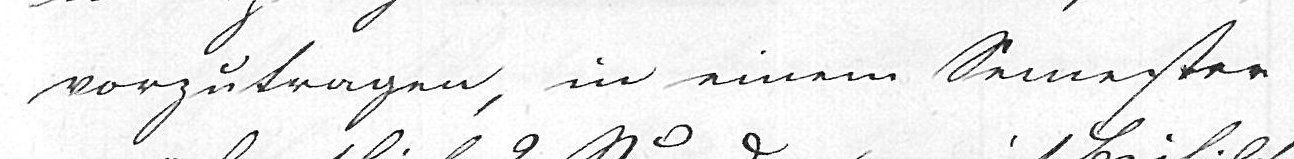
vorzutragen, in einem Semester
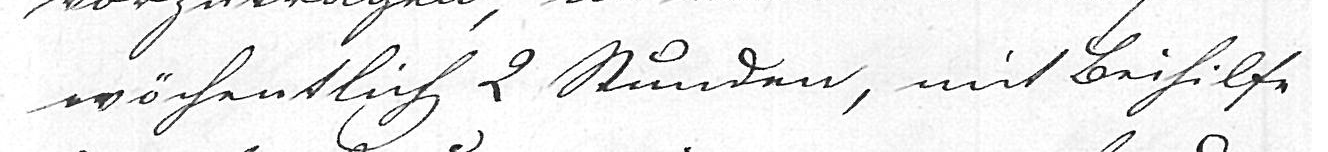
wöchentliche 2 Stunden, mit Beihilfe
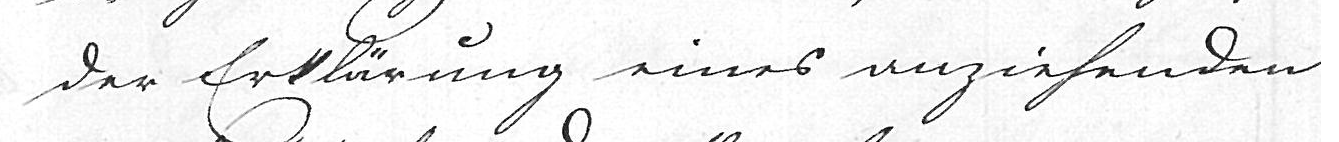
der Erklärung eines anziehenden
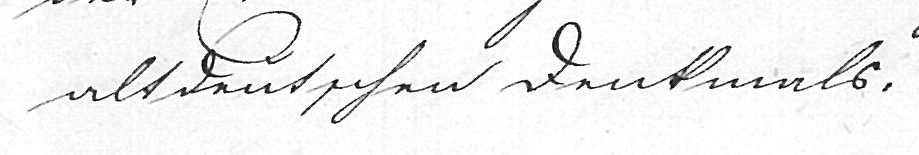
altdeutschen Denkmals.
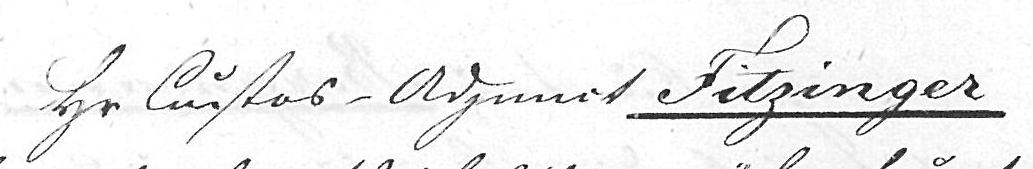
Hr Custos-Adjunct Fitzinger
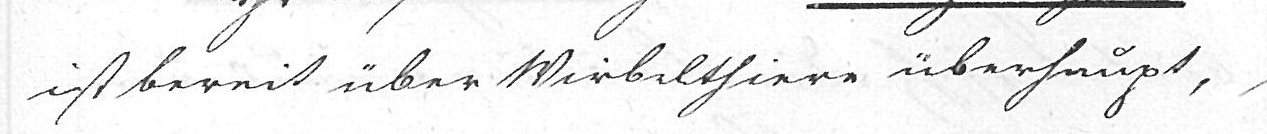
ist bereit über Wirbelthiere überhaupt,
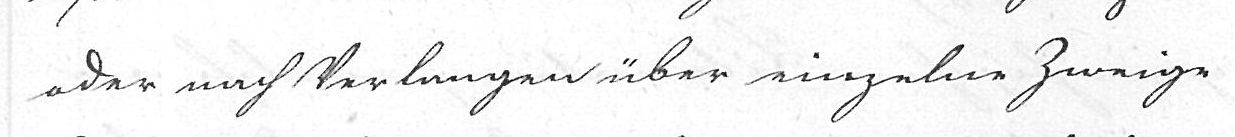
oder nach Verlangen über einzelne Zweige
